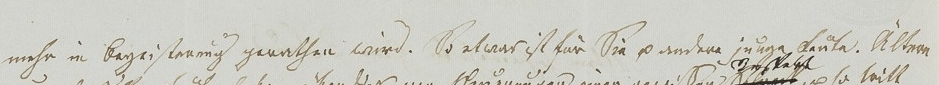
mehr in Begeisterung gerathen wird. So etwas ist für Sie & andere junge Leute. Ältere
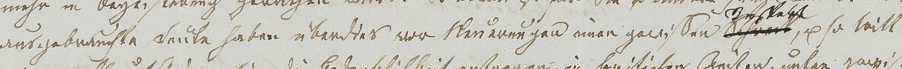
ausgebrauchte Leute haben überdies vor Neuerungen einen gewissen SchreckRespekt, & so tritt
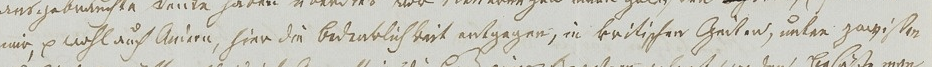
mir, & wohl auch Andern, hier die Bedenklichkeit entgegen, in kritischen Zeiten, unter gewissen
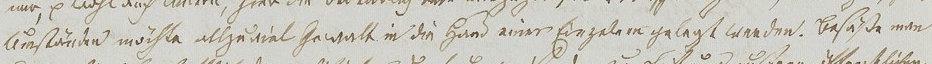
Umständen möchte allzuviel Gewalt in die Hand eines Einzelnen gelegt werden. Besäße man
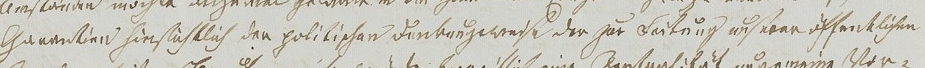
Garantien hinsichtlich der politischen Denkungsweise der zur Leitung unserer öffentlichen
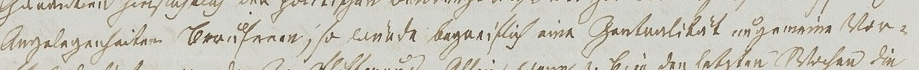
Angelegenheiten Berufenen, so würde begreiflich eine Zentralität ungemeine Vor-
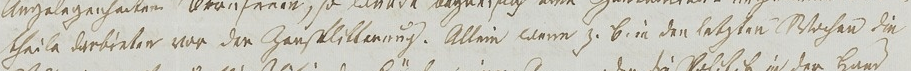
theile darbieten vor der Zersplitterung. Allein wenn z. B. in den letzten Wochen die
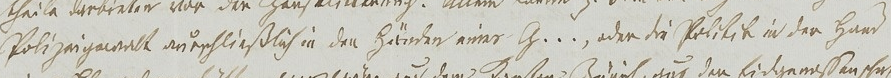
Polizeigewalt ausschließlich in den Händen eines Z..., oder die Politik in der Hand
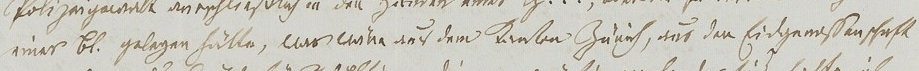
eines Bl. gelegen hätte, was wäre aus dem Kanton Zürich, aus der Eidgenossenschaft
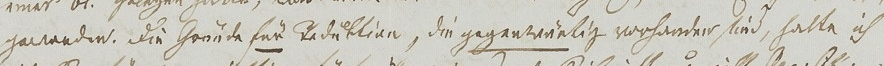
geworden. Die Gründe für Reduktion, die gegenwärtig vorhanden sind, halte ich
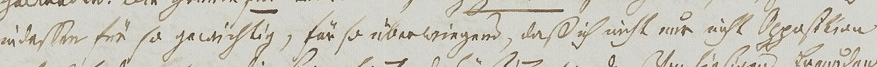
indessen für so gewichtig, für so überwiegend, daß ich nicht nur nicht Opposition
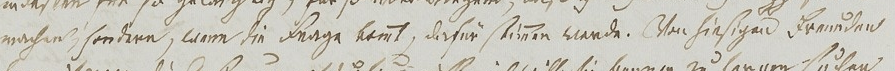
machen, sondern, wenn die Frage kommt, dafür stimmen werde. Von hiesigen Freunden
